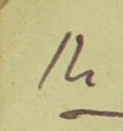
12
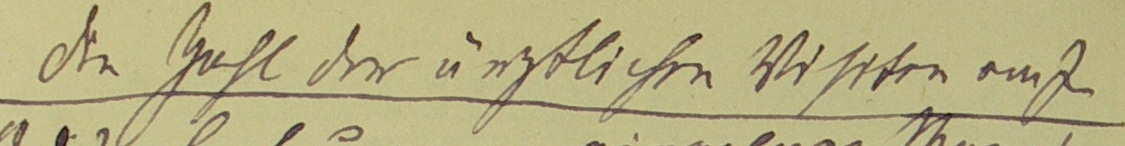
Die Zahl der ärztlichen Visiten im Jahre
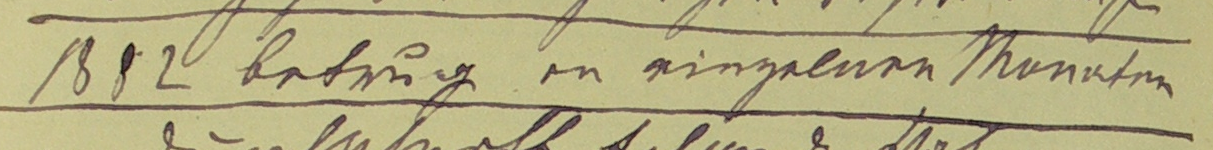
1882 betrug in einzelnen Monaten
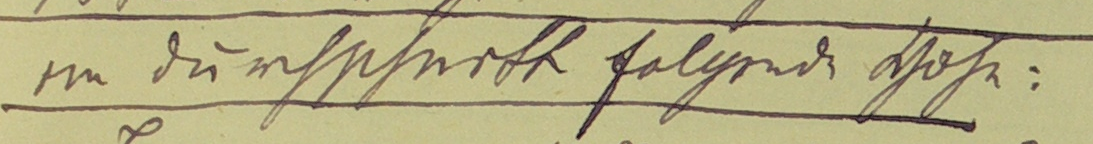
im Durchschnitt folgende Höhe:
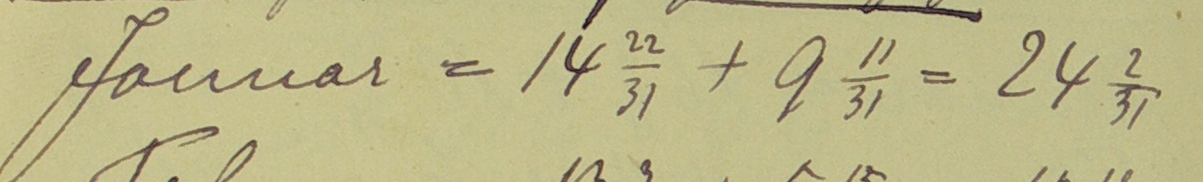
Januar = 14 22/31 + 9 11/31 = 24 2/31
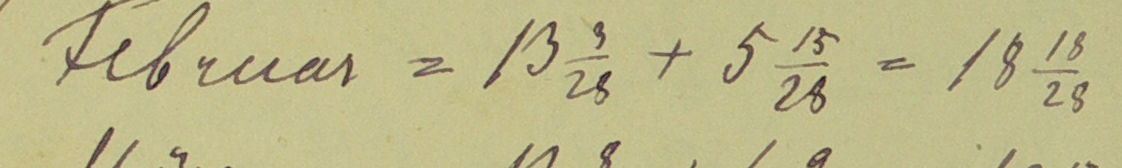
Februar = 13 3/28 + 5 15/28 = 18 18/28
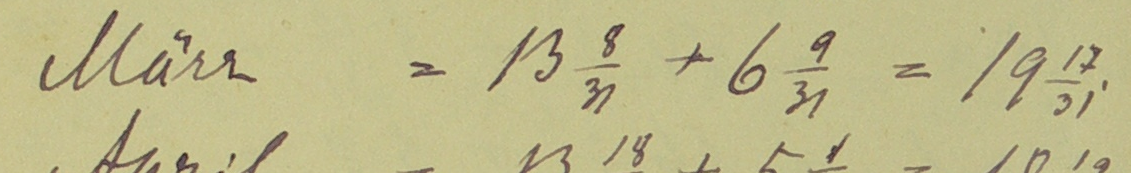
März = 13 8/31 + 6 9/31 = 19 17/31
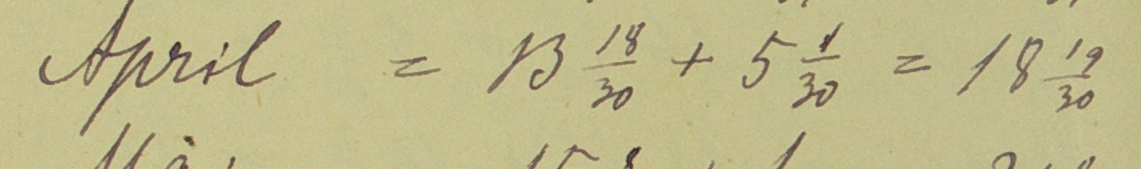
April = 13 18/30 + 5 1/30 = 18 19/30
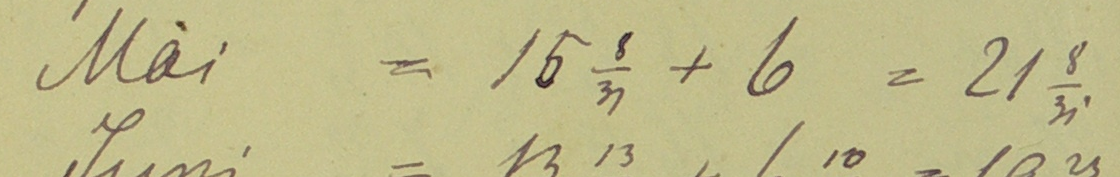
Mai = 15 8/31 + 6 = 21 8/31
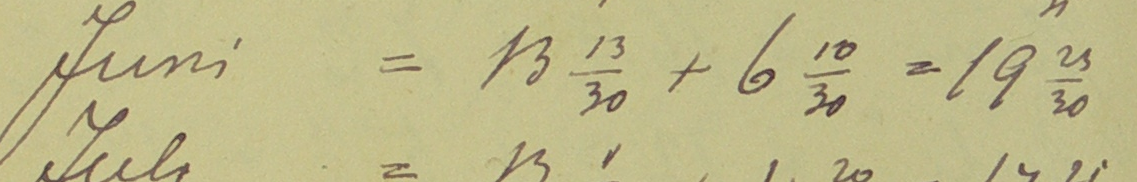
Juni = 13 13/30 + 6 10/30 = 19 23/30
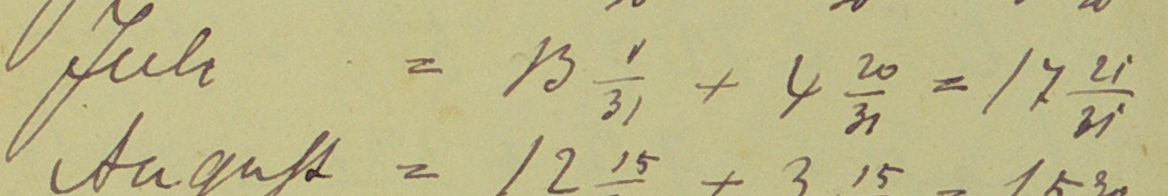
Juli = 13 13/31 + 4 20/31 = 17 21/31
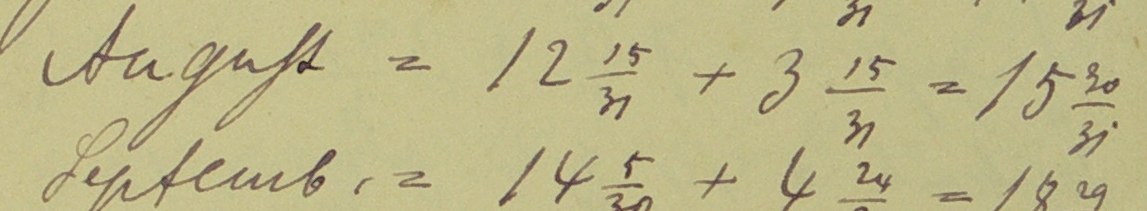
August = 12 15/31 + 3 15/31 = 15 30/31
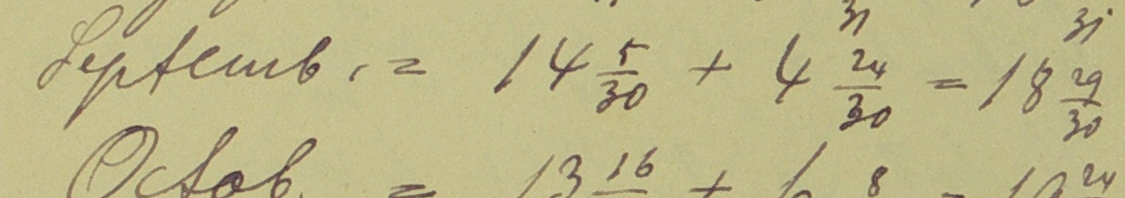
Septem. = 14 5/30 + 4 24/30 = 18 29/30
